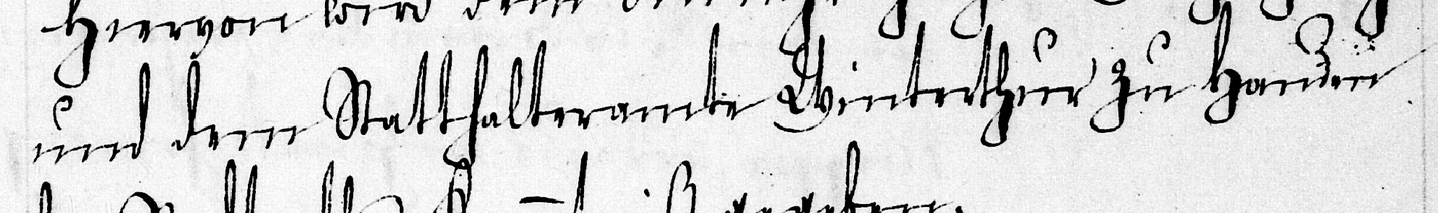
und dem Statthalteramte Winterthur zu Handen
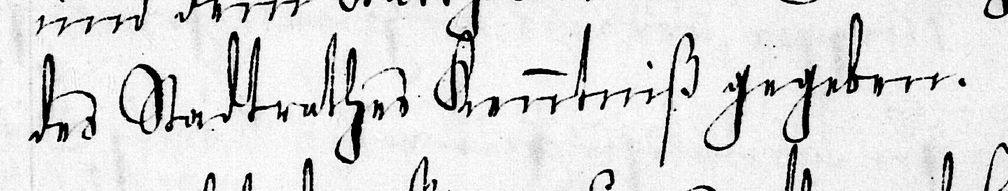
des Stadtrathes Kenntniß gegeben.
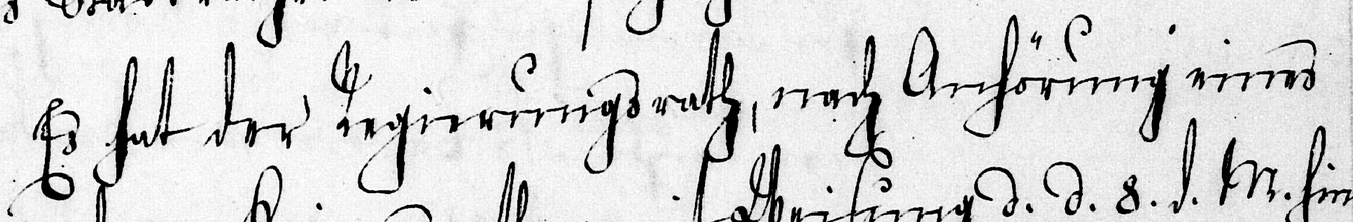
Es hat der Regierungsrath, nach Anhörung eines
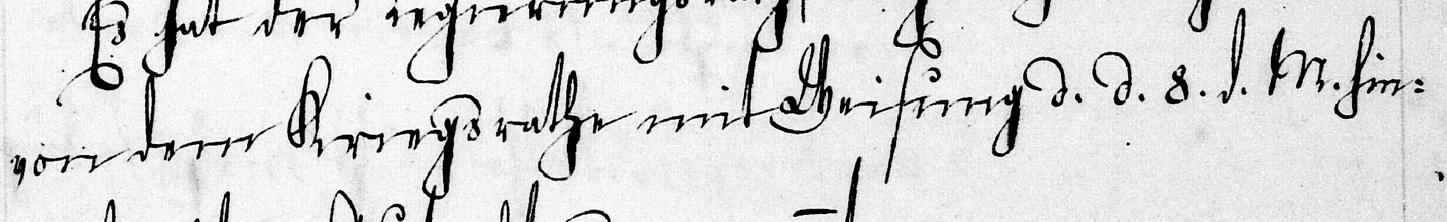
von dem Kriegsrathe mit Weisung d. d. 8. d. M. hin¬
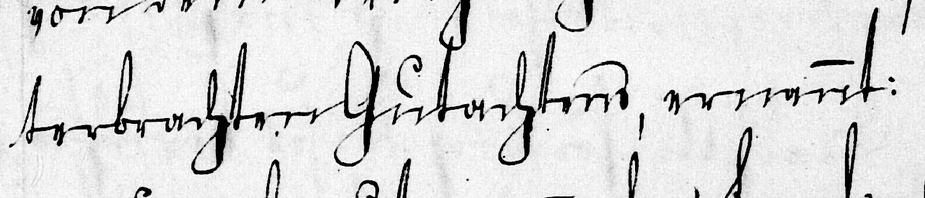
terbrachten Gutachtens, ernannt:
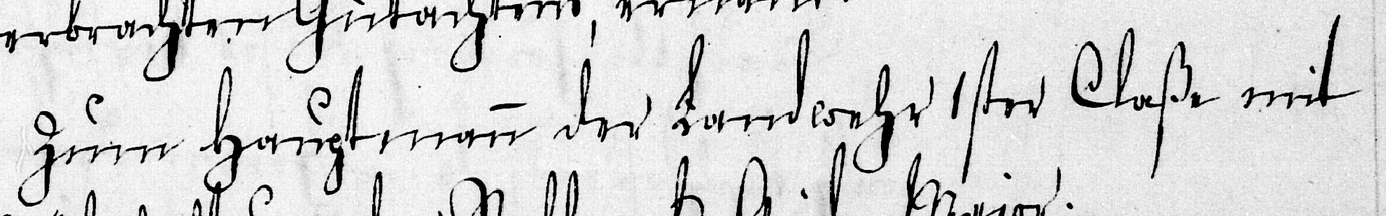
Zum Hauptmann der Landwehr 1ster Claße mit
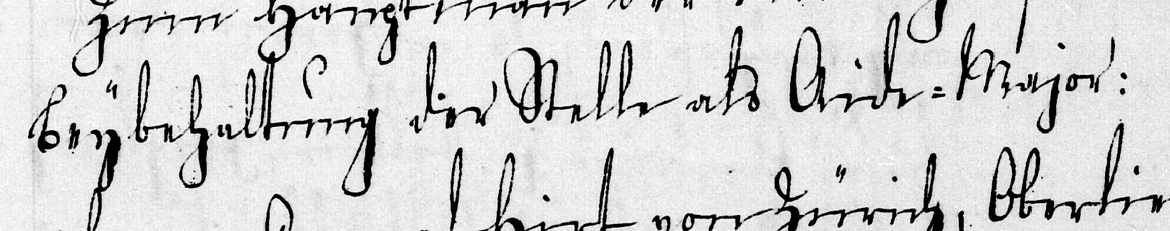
Beybehaltung der Stelle als Aide-Major:
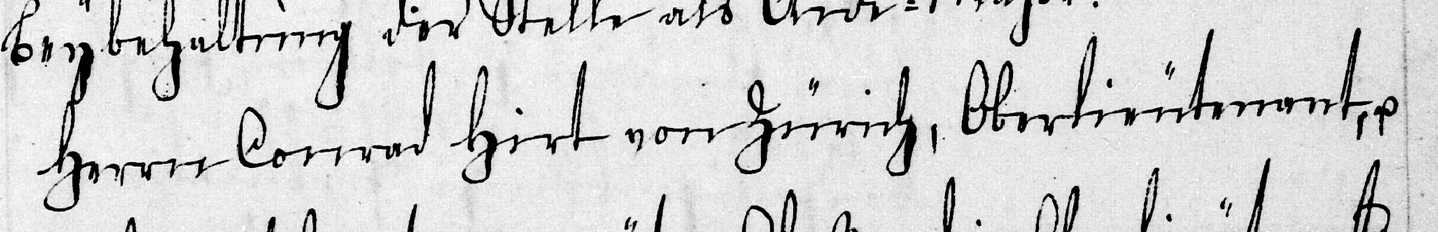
Herrn Conrad Hirt von Zürich, Oberlieutenant,
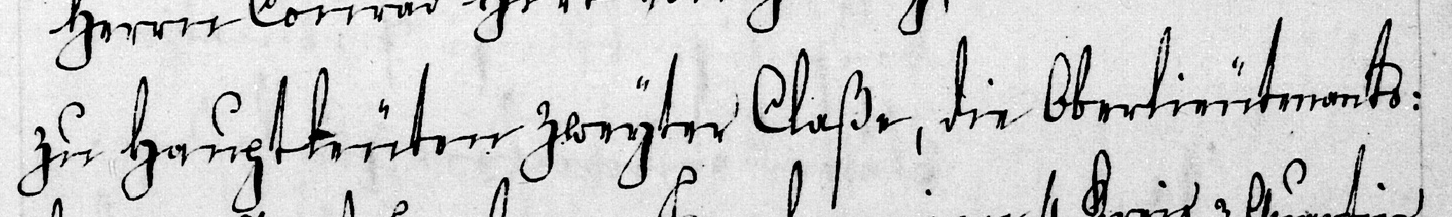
zu Hauptleuten zweyter Claße, die Oberlieutenants:
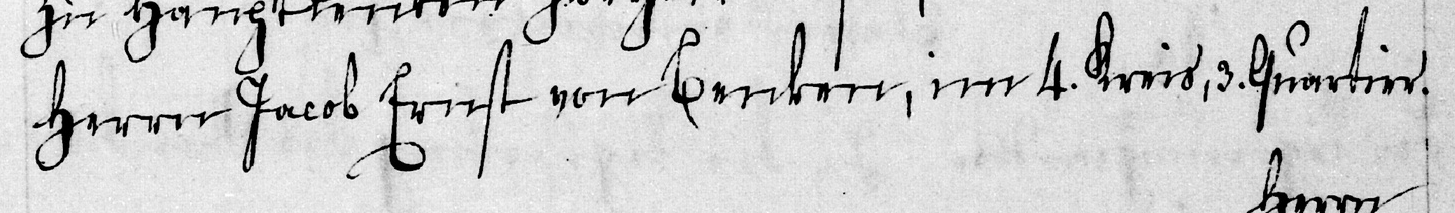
Herrn Jacob Ernst von Benken, im 4. Kreis, 3. Quartier.
